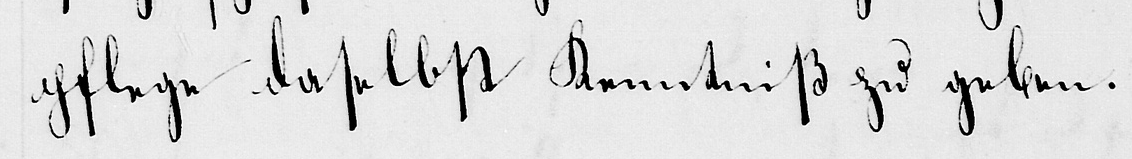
pflege daselbst Kenntniß zu geben.
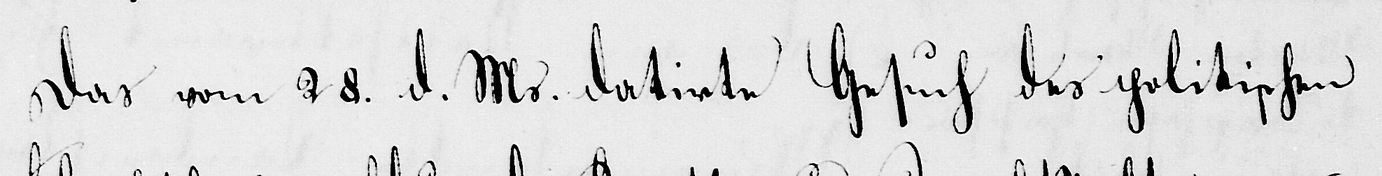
Das vom 28. d. Ms. datirte Gesuch des politischen
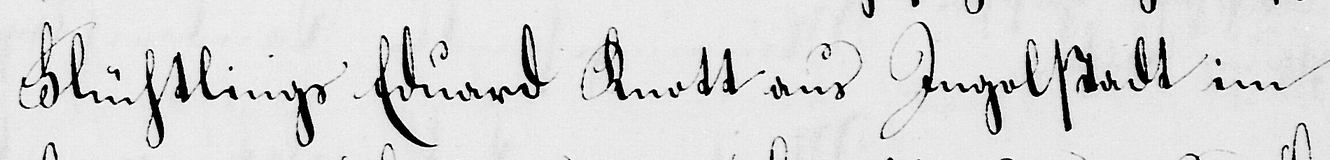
Flüchtlings Eduard Knott aus Ingolstadt im
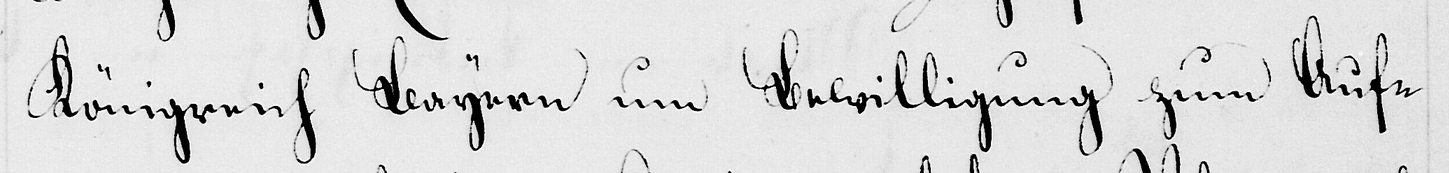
Königreich Bayern um Bewilligung zum Auf¬
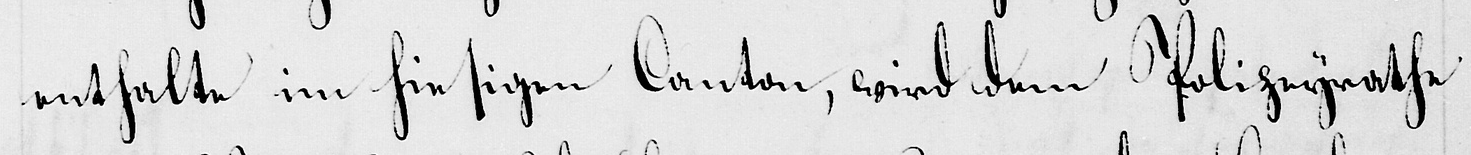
enthalte im hiesigen Canton, wird dem Polizeyrathe
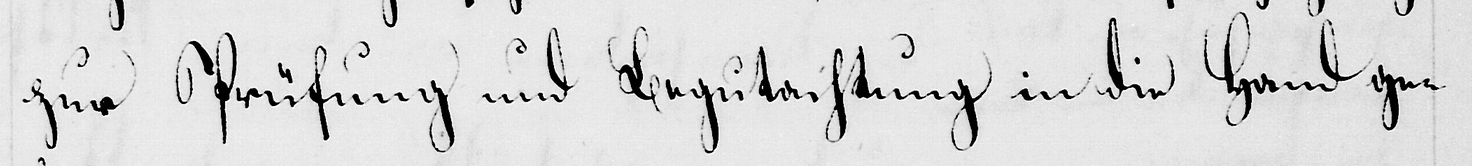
zur Prüfung und Begutachtung in die Hand ge¬
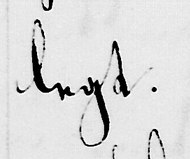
legt.
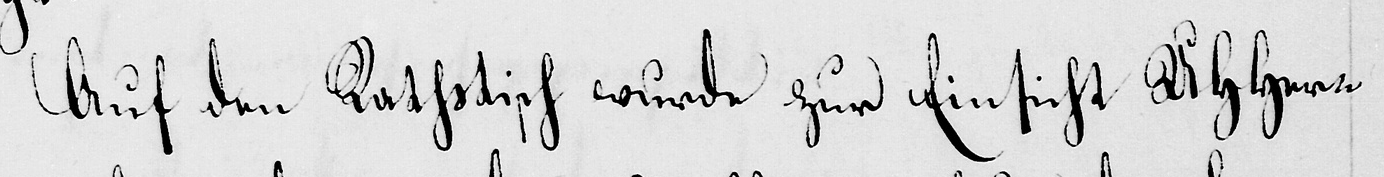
Auf den Rathstisch wurde zur Einsicht UHHer¬
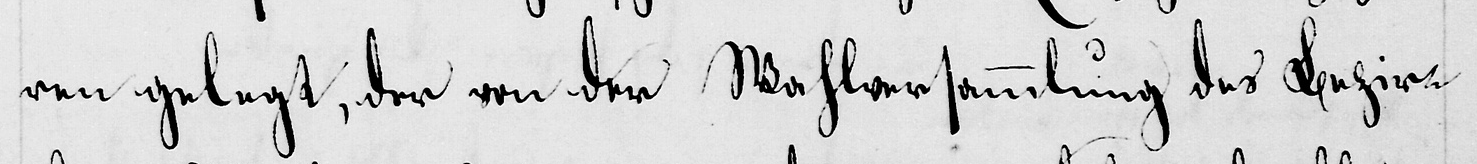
ren gelegt, der von der Wahlversammlung des Bezir¬
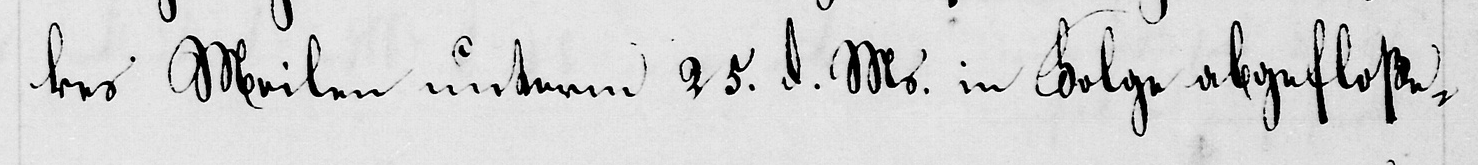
kes Meilen unterm 25. d. Ms. in Folge abgefloße-
